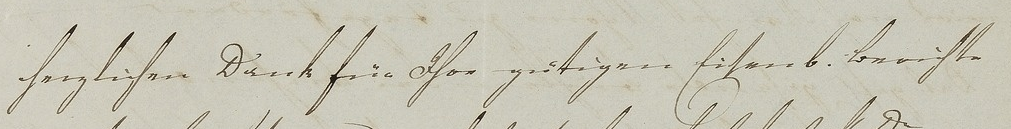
Herzlichen Dank für Ihre gütigen Eisenb.Berichte
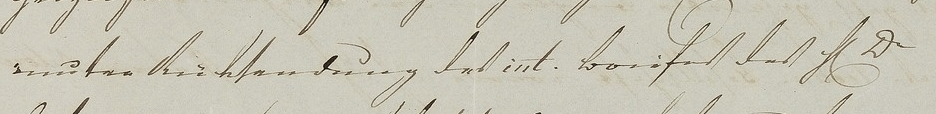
unter Rücksendung des int. Briefes des H. Dr
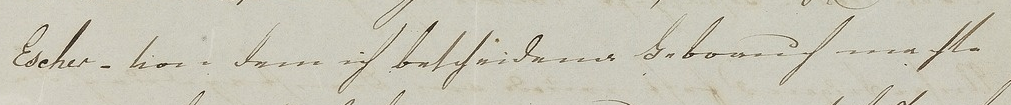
Escher, von dem ich bescheidenen Gebrauch machte
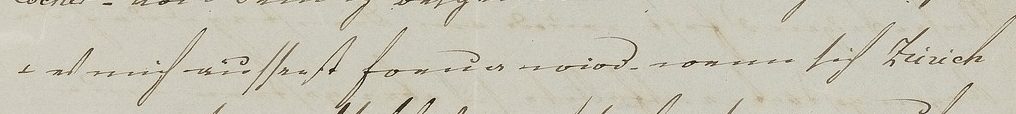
& es mich aeusserst freuen wird, wenn sich Zürich
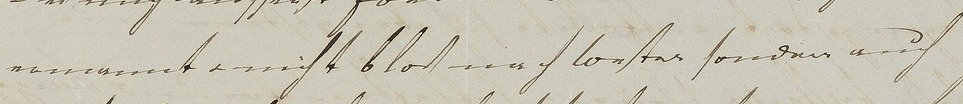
ermannt & nicht blos nach Westen sondern auch
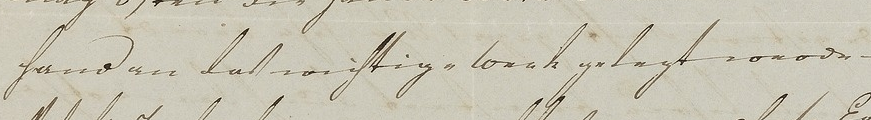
Hand an das wichtige Werk gelegt werde.
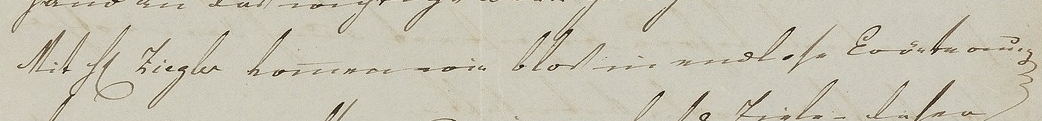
Mit H. Ziegler kommen wir blos in endlose Erörterungen,
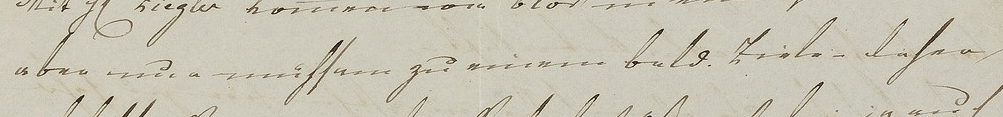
aber nur mühsam zu einem bald. Ziele, daher
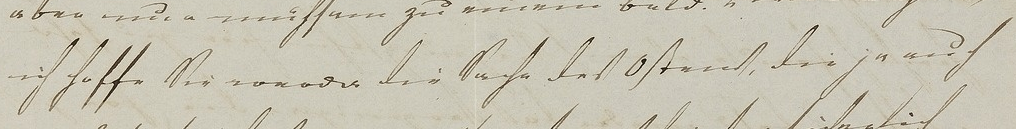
ich hoffe Sie werden die Sache des Ostens, die ja auch
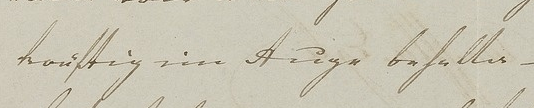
kräftig im Auge behalten.
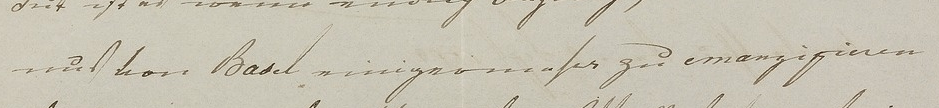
uns von Basel einigermasen zu emanzipieren
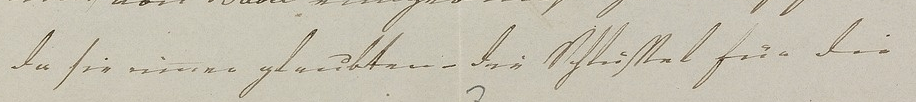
da sie immer glaubten den Schlüssel für die
